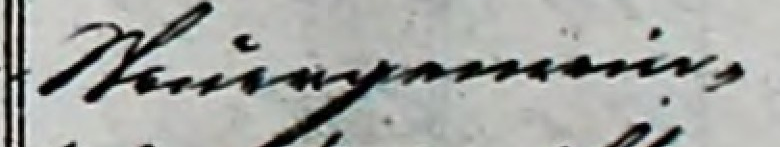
und in der
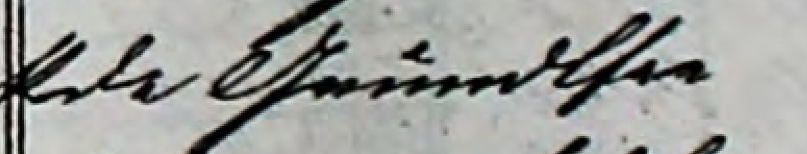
Steuergemein„
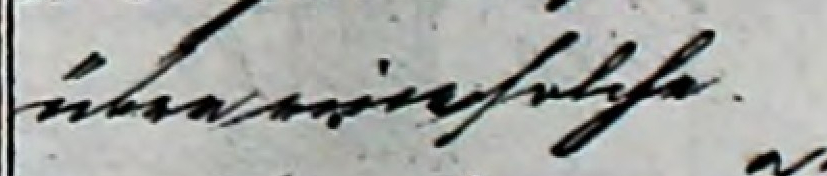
de Grundlsee
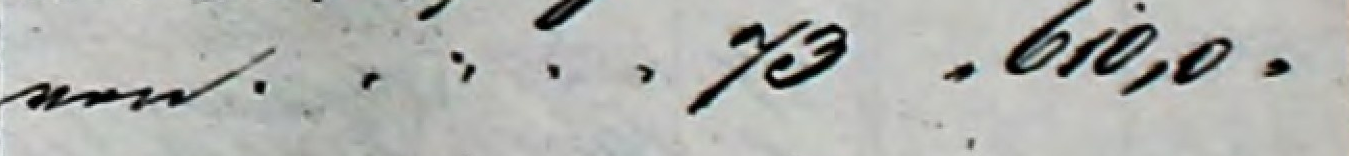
über eine solche
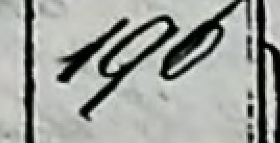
196
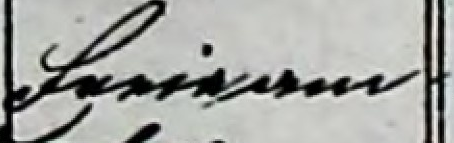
Freie am
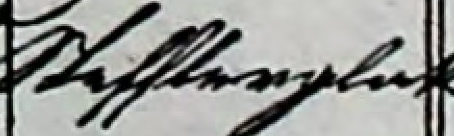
Steffterglak
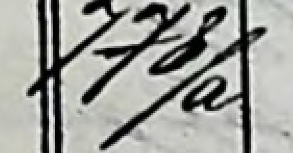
778/a
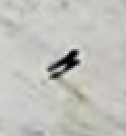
„
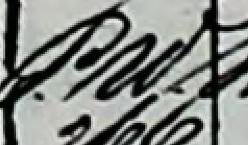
P.W
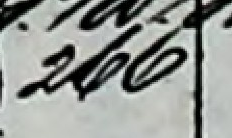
266
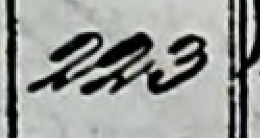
223
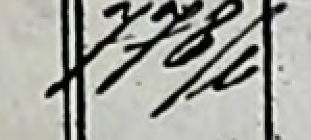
778/b
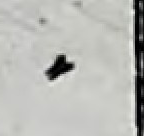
„
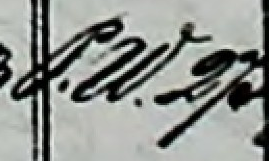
P.W. 275
